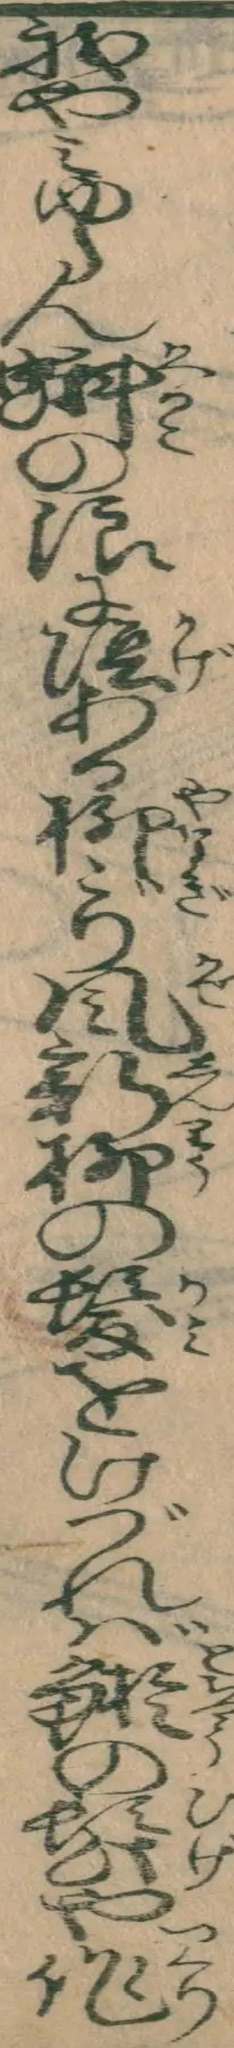我やみゆらん蝌の浪に陰ある柳こり風新柳の髪をけづれば鰌の髭や作
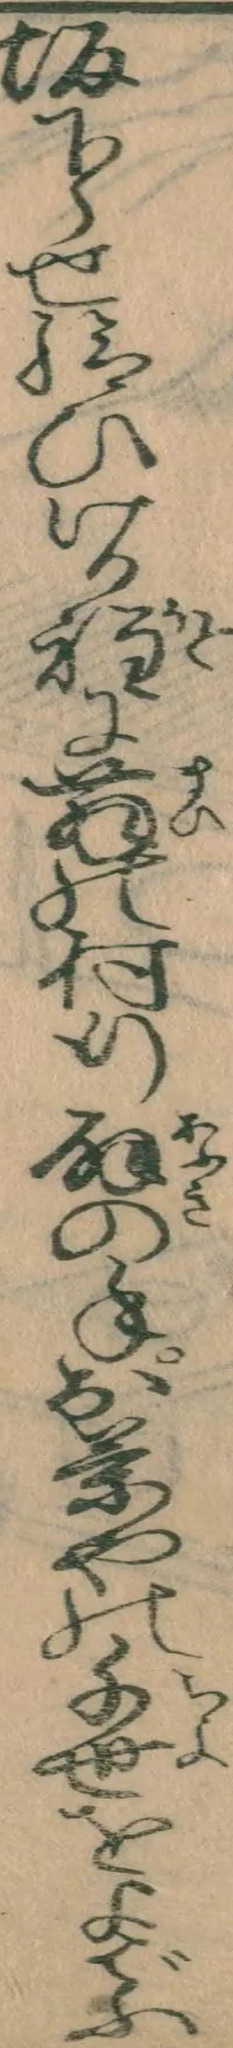坂下らせ給ひける程に舞の村行扇の手。お茶やの千世をよばふ
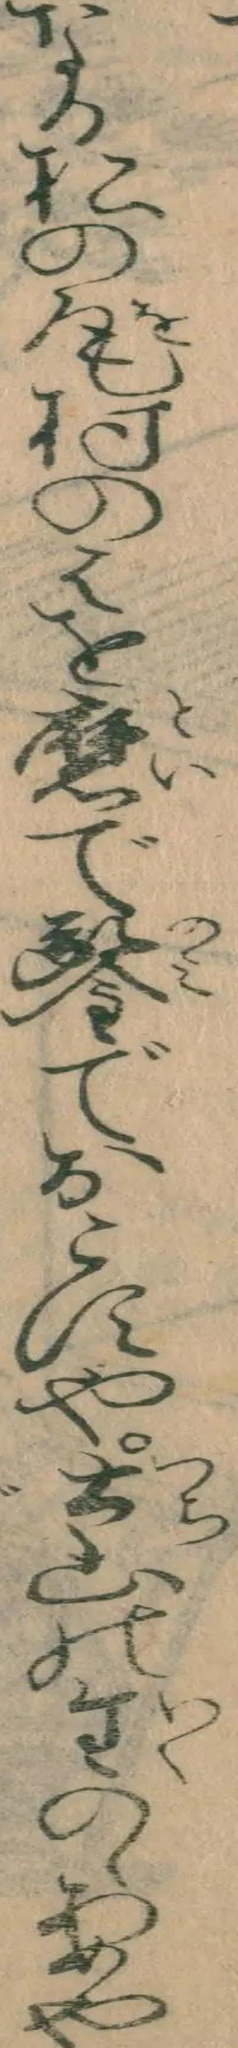なる松の尾村のはを磨で鑿でおこすや。土山の生のゝあめや
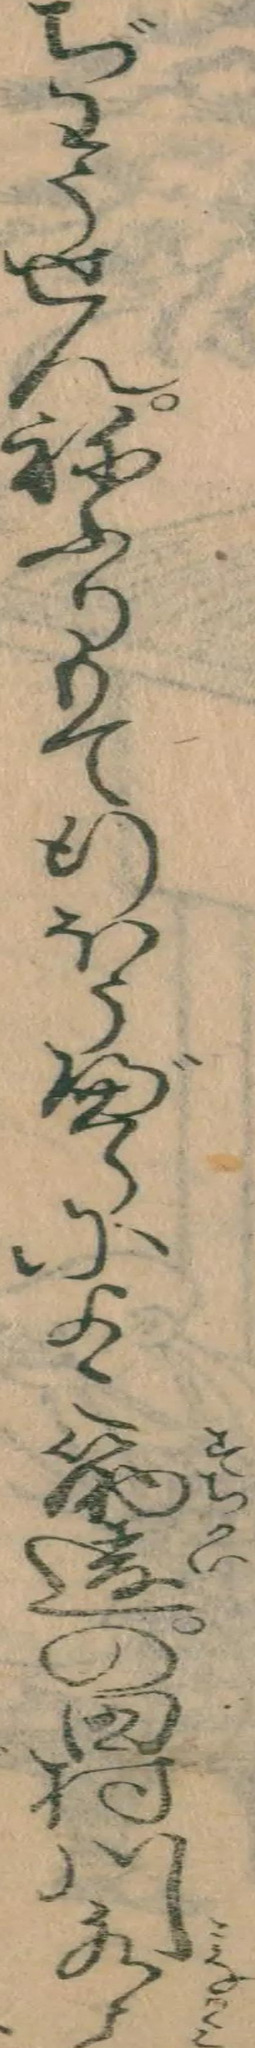ぢわうせん。ねふりもて行ほうべらによこ筋違。の田村川水上
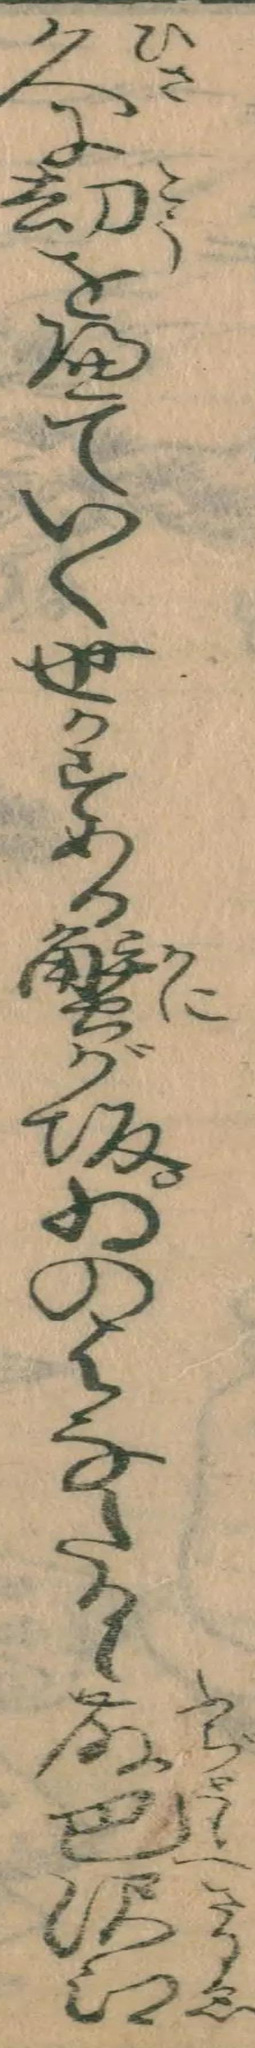久に劫をへていく世かすめる蟹が坂。ゐのはなたるゝ藤巴沢江
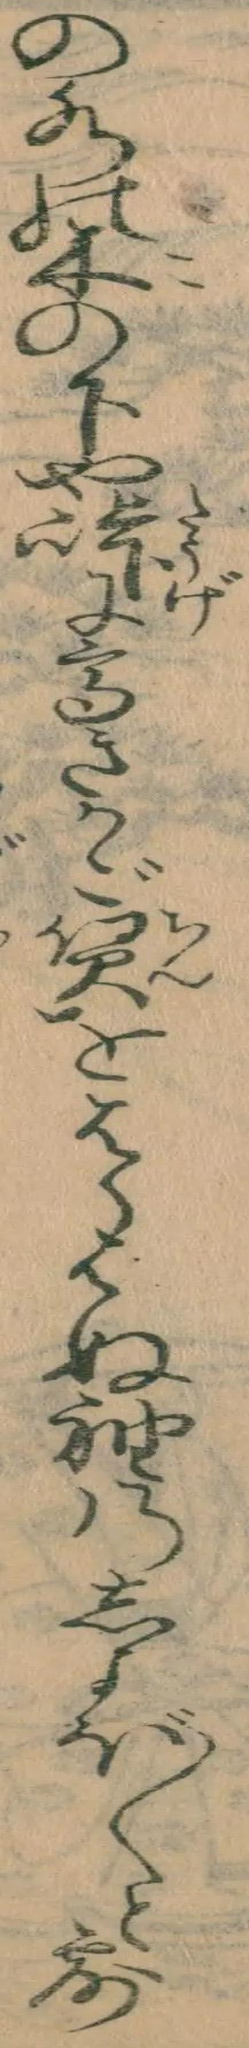の水の木の下や峠に高きかご賃をはらはぬ袖のしよぼ〳〵と露
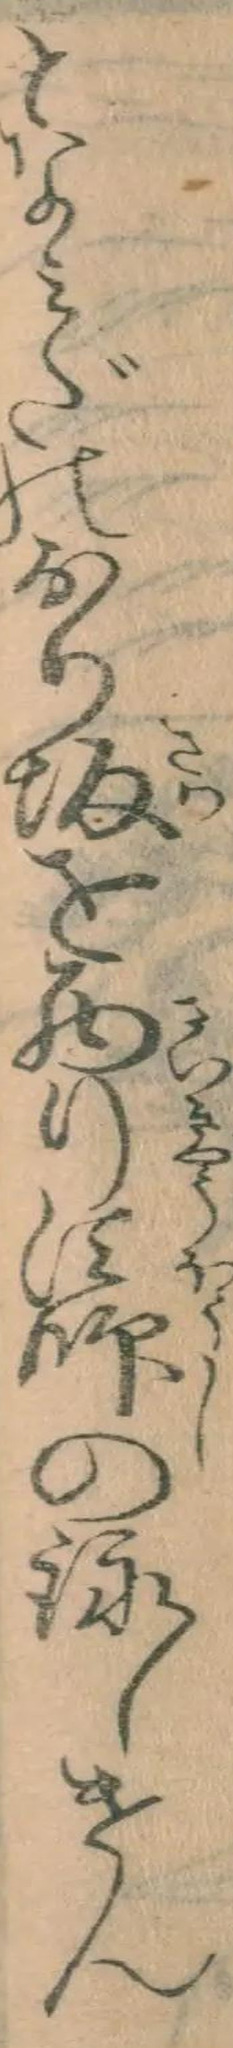となみだのおり坂を西行法師の詠しけん
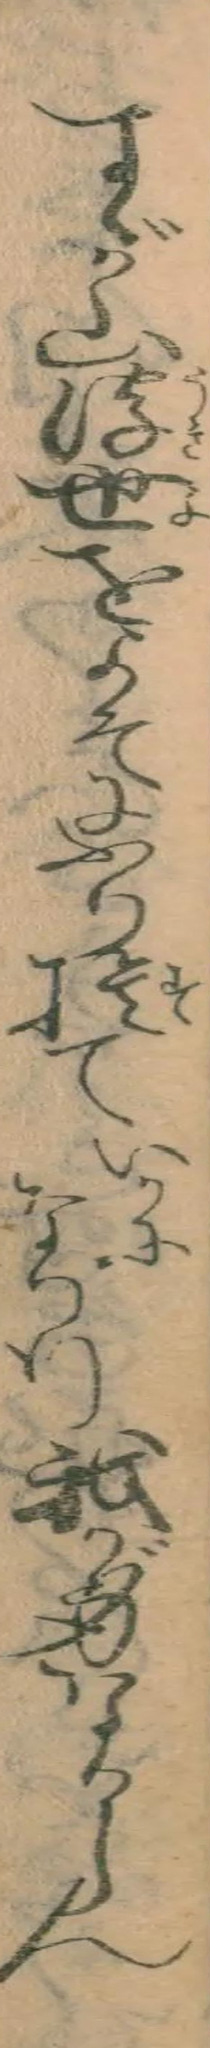すゞか山浮世をよそにふり捨ていかになり行我が身なるらん
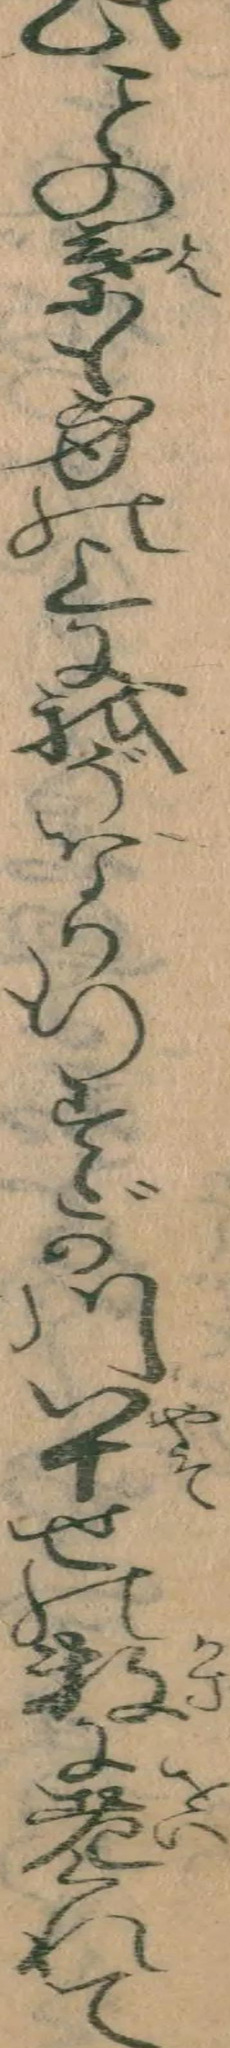此ことの葉も身の上に我がなり行すゞか川八十せの数に老くれて
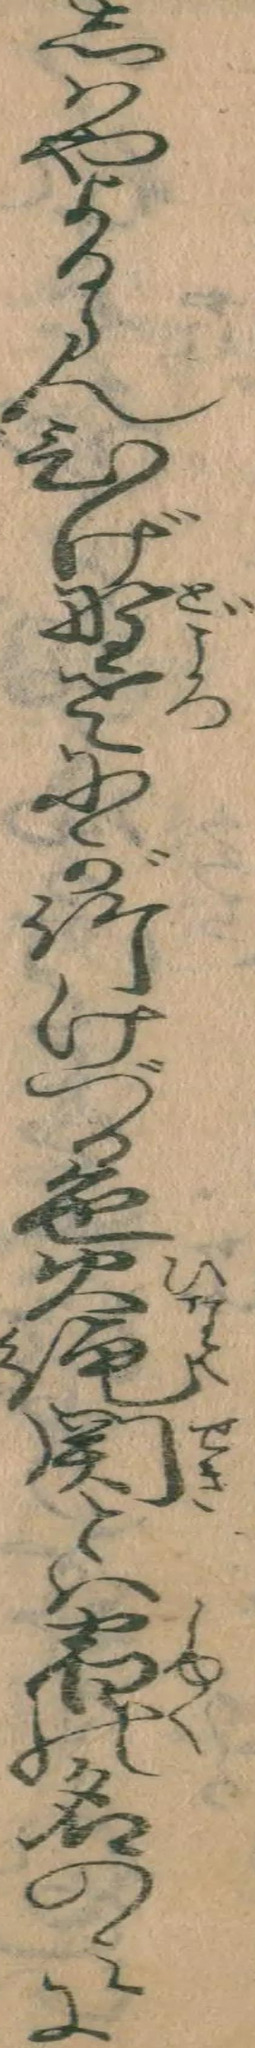しはやよるらんひげ野老にが竹けづる色火縄関とは宿の名のみに
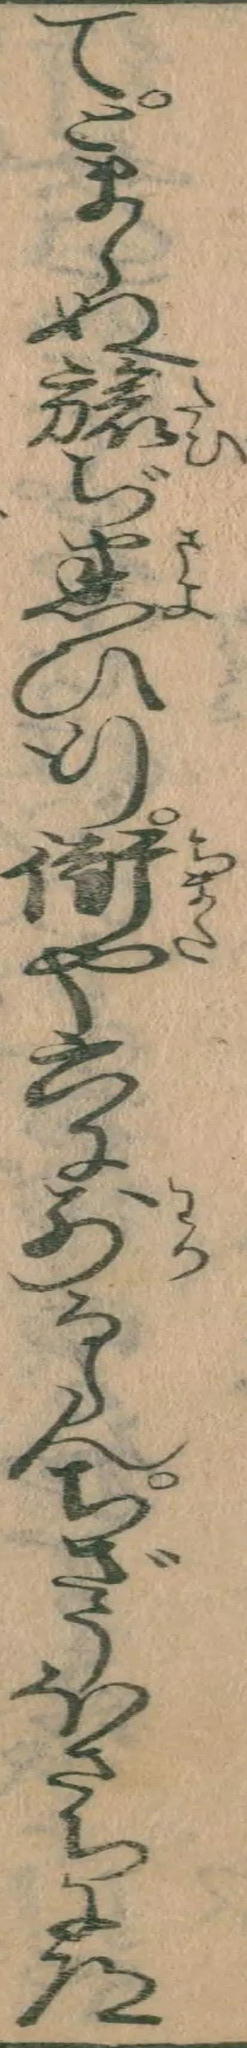て。とまらぬ旅ぢ迷ひ行。衢や六に別るらん。ちざうほさちに道
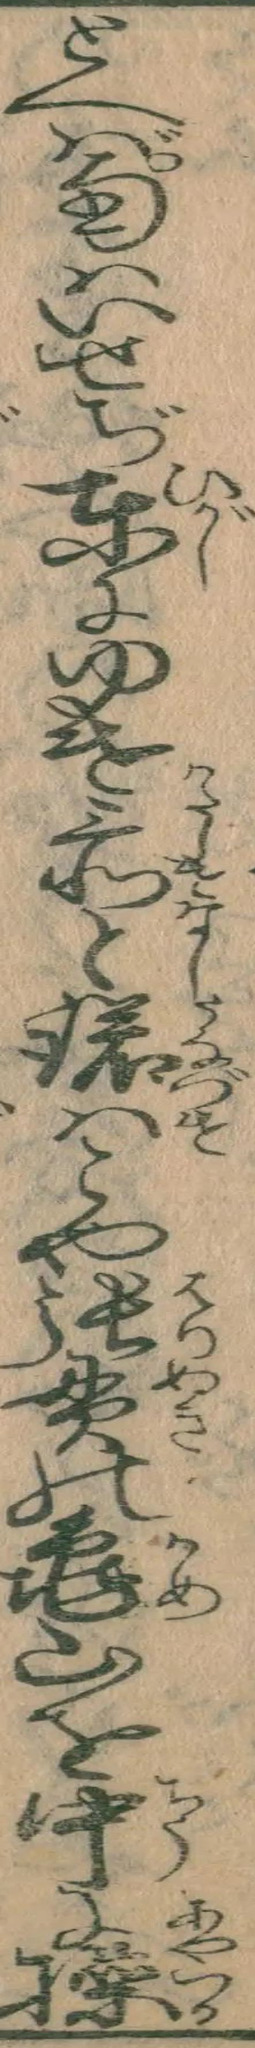とへば。南はいせぢ東にゆけ忝と諾はこや張貫の亀山を中に操
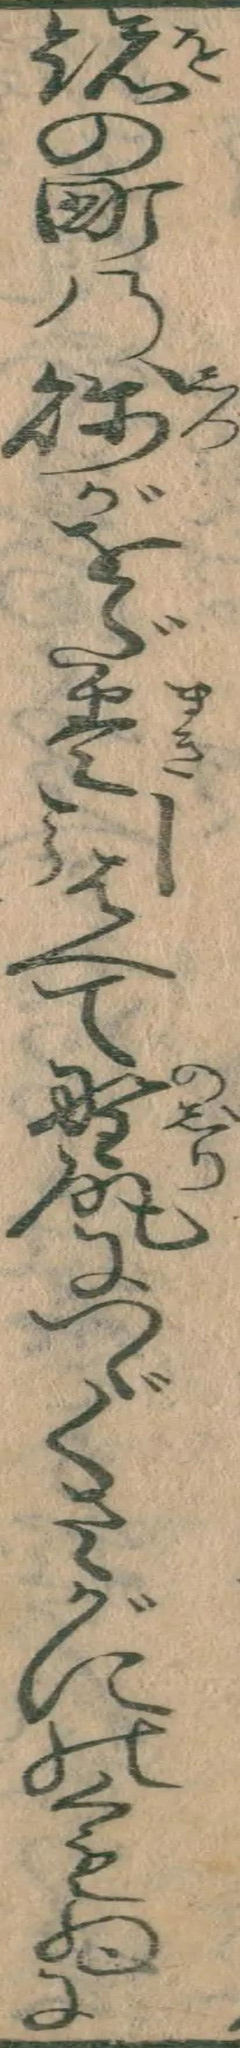緒の町の賎がをだ巻引はへて野尻につゞくさゝがにのくもゐに
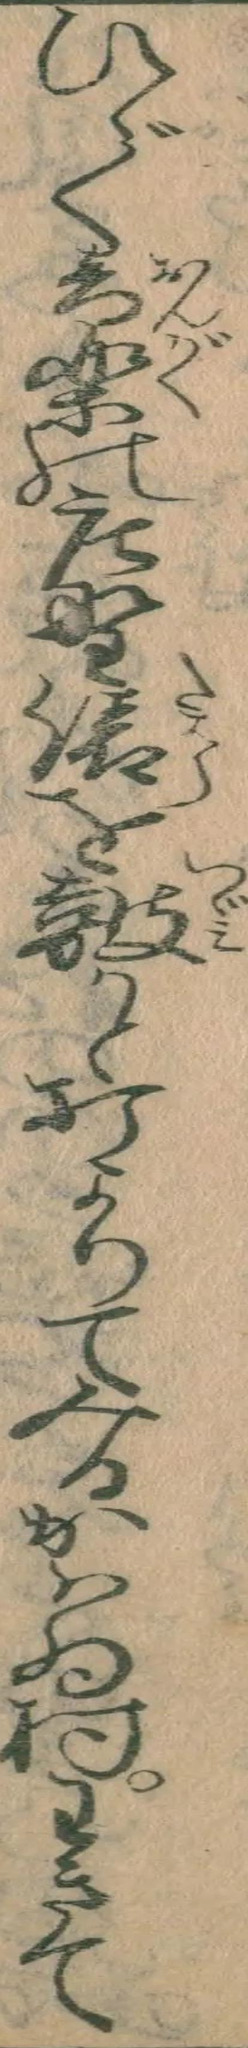ひゞく音楽の庄野俵を鼓かと打よりてみるかはゐ村。わきて
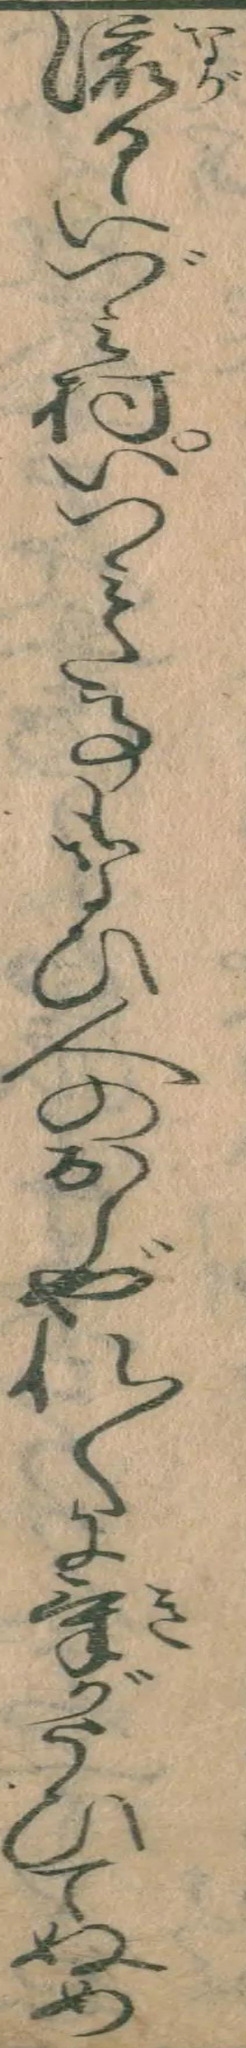流るゝいづみ村。いつみた事もなひ人のおじやれ〳〵に気がうひてぬめ
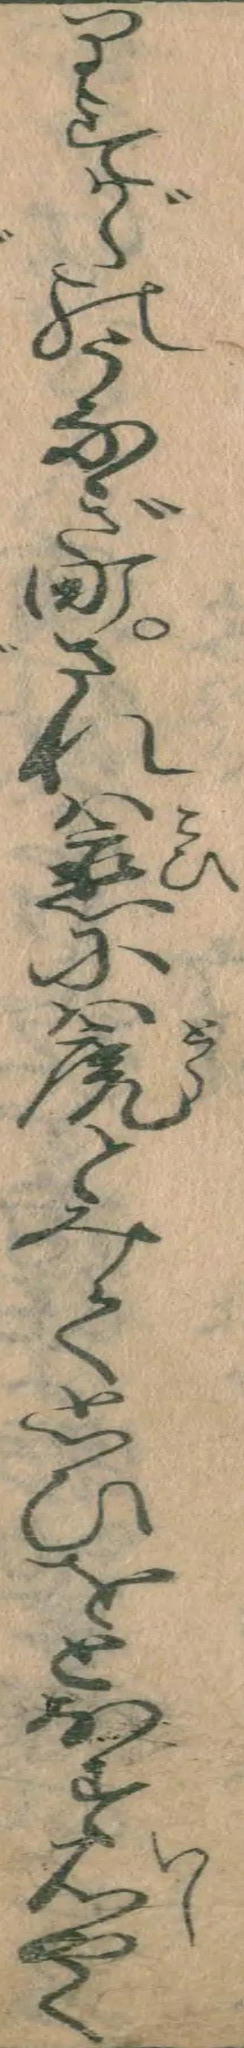りすがたのうなぎ町。されは恋には虎とみて思ひをとほす石やく
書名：新竹斎 5巻
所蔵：国立国会図書館 National Diet Library, JAPAN
